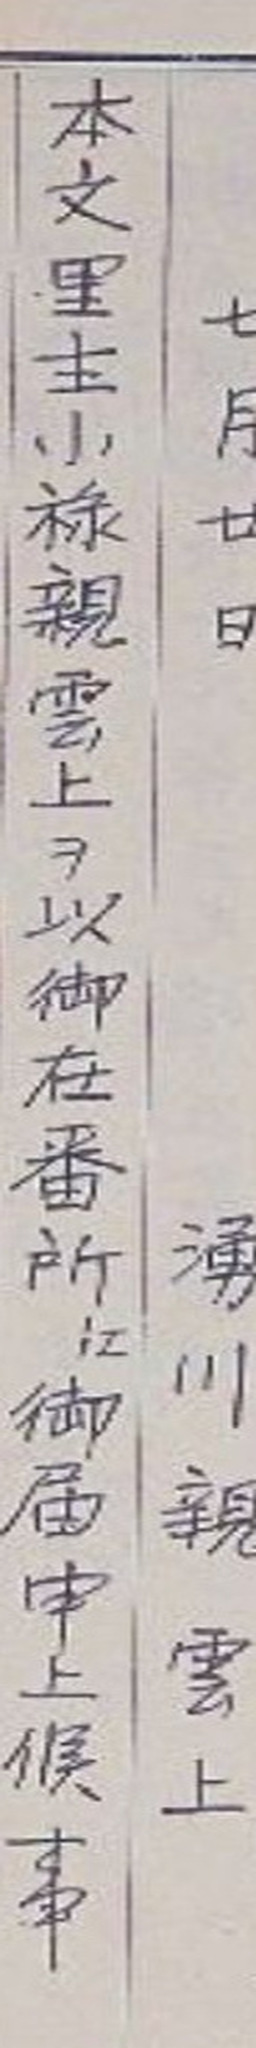本文里主小禄親雲上を以て御在番所え御届申上候事
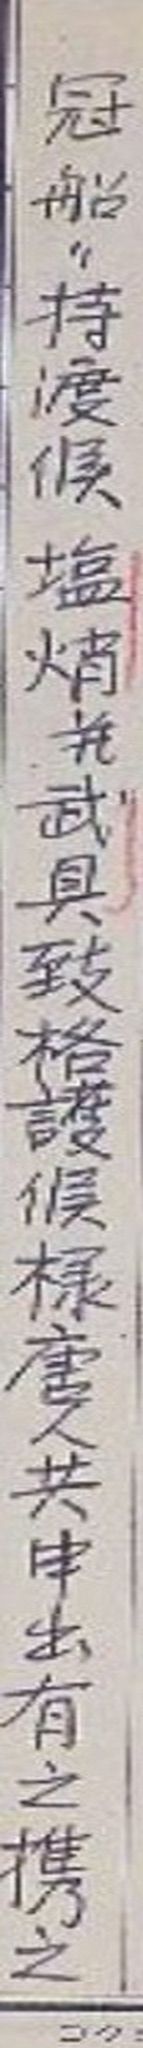冠船々持渡候煙硝并武具致格護候様唐人共申出有之携之
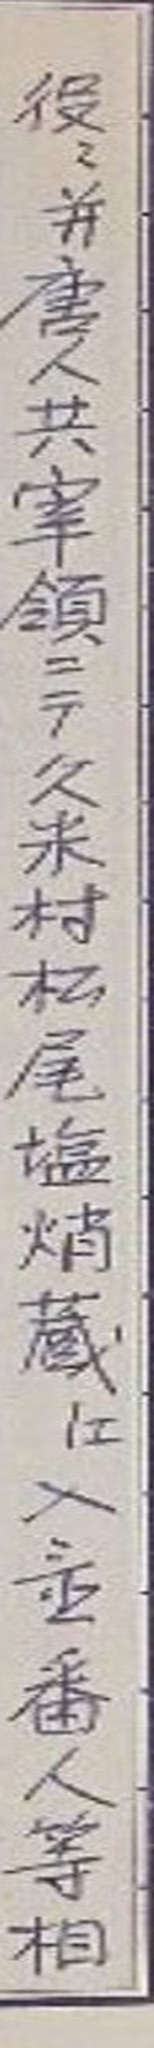役々并唐人共宰領にて久米村松尾塩硝蔵え入置番人等相
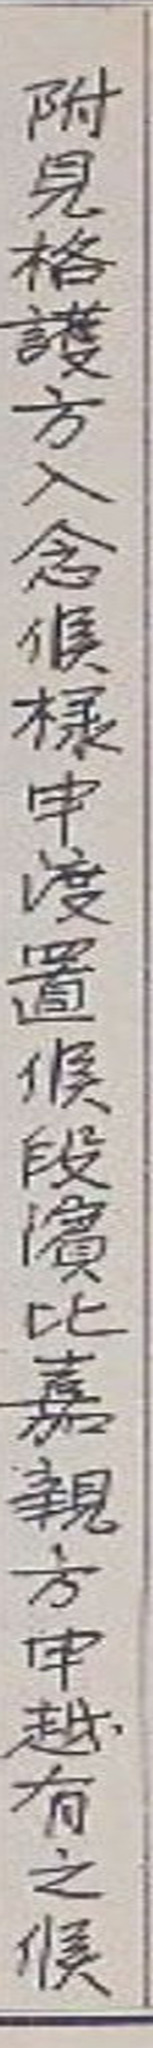附見格護方入念候様申渡置候段浜比嘉親方申越有之候
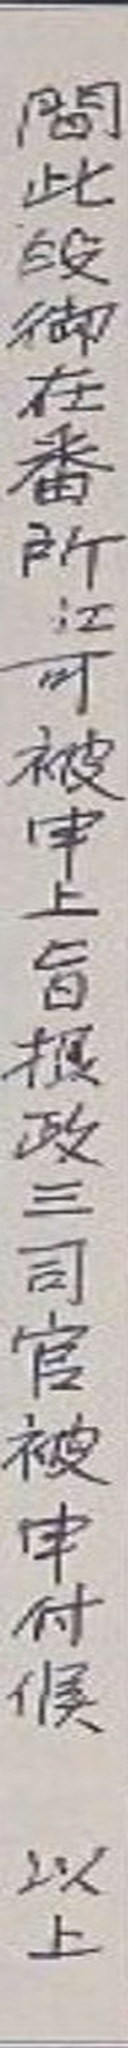間此段御在番所え可被申上旨摂政三司官被申付候以上
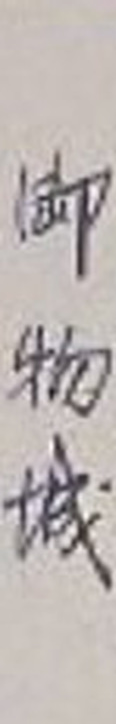御物城
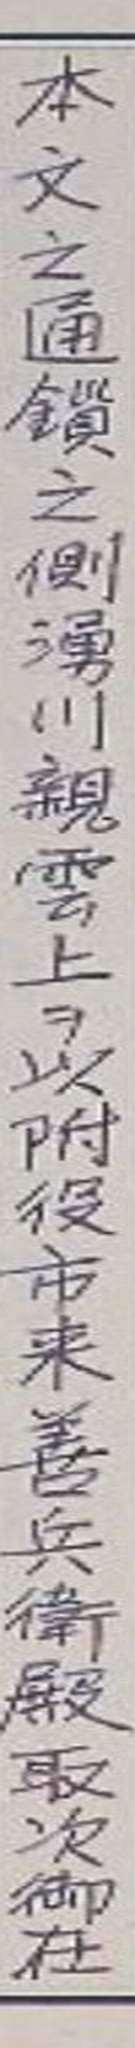本文之通鎖之側湧川親雲上を以附役市来善兵衛殿取次御在
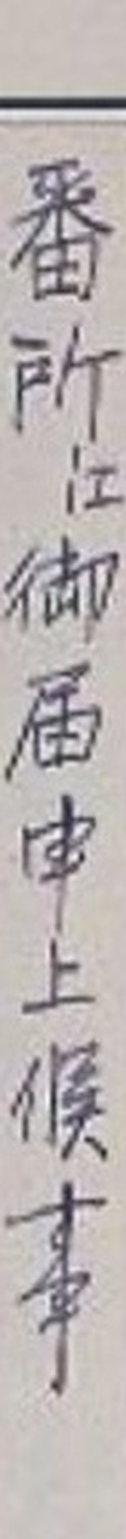番所え御届申上候事
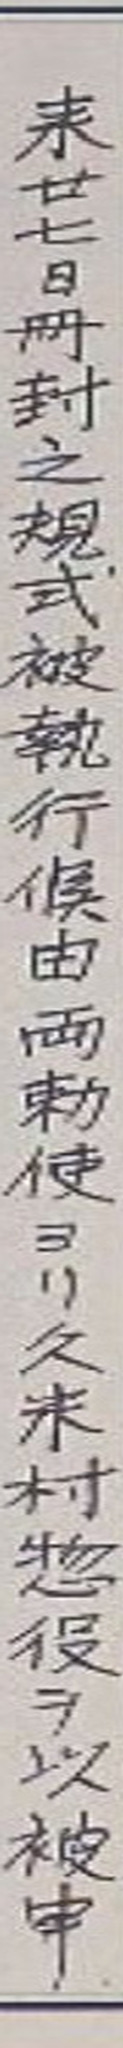来廿七日冊封之規式被執行候由両勅使より久米村惣役を以被申
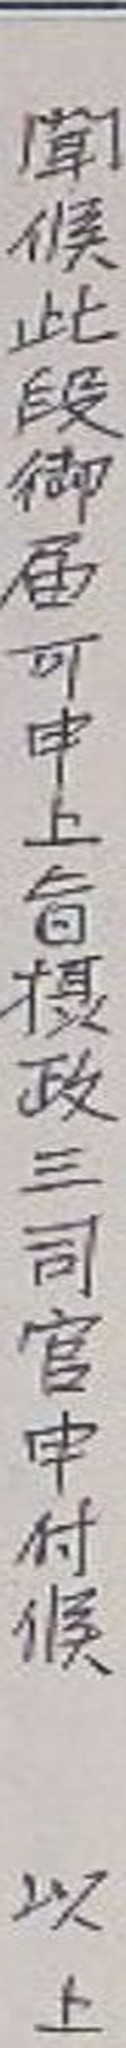聞候此段御届可申上旨摂政三司官申付候以上
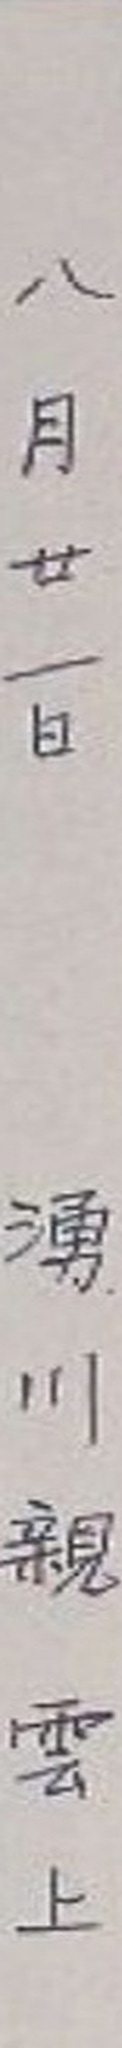八月廿一日湧川親雲上
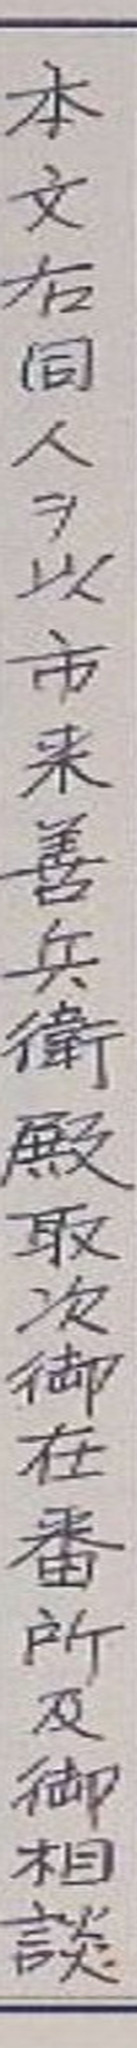本文右同人を以市来善兵衛殿取次御在番所及御相談
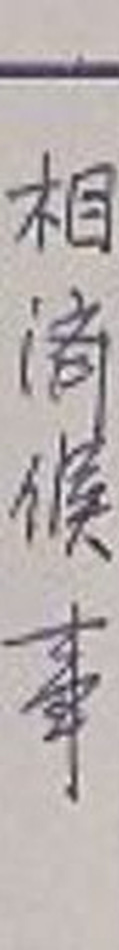相済候事

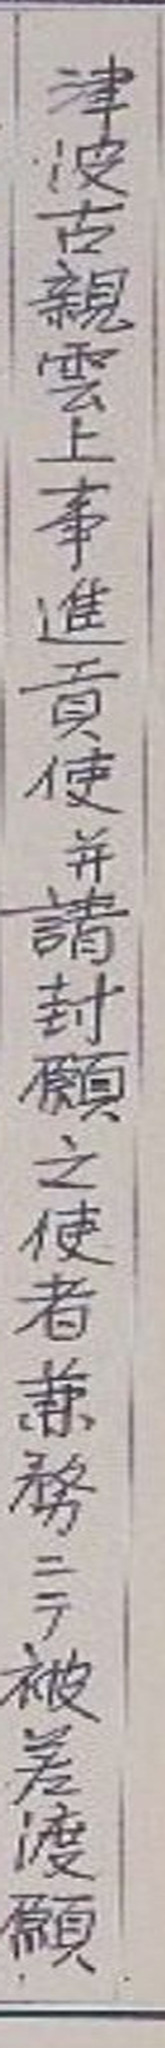津波古親雲上事進貢使并請封願之使者兼務にて被差渡願
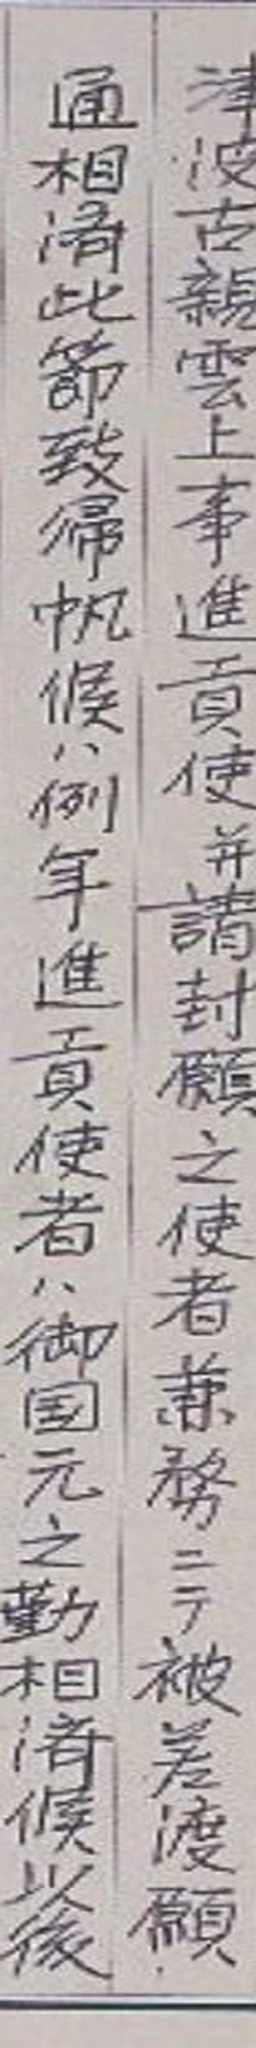通相済此節致帰帆候は例年進貢使者は御国元之勤相済候以後
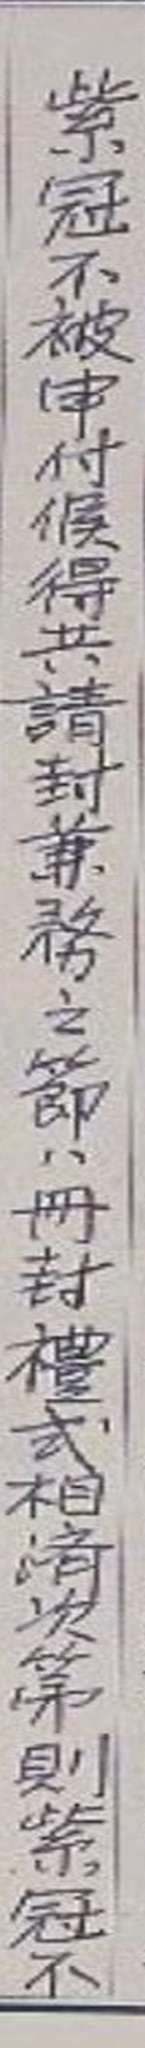紫冠不被申付候得共請封兼務之節は冊封礼式相済次第則紫冠不
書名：支那冊封使来琉諸記 下巻
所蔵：University of the Ryukyus Library
